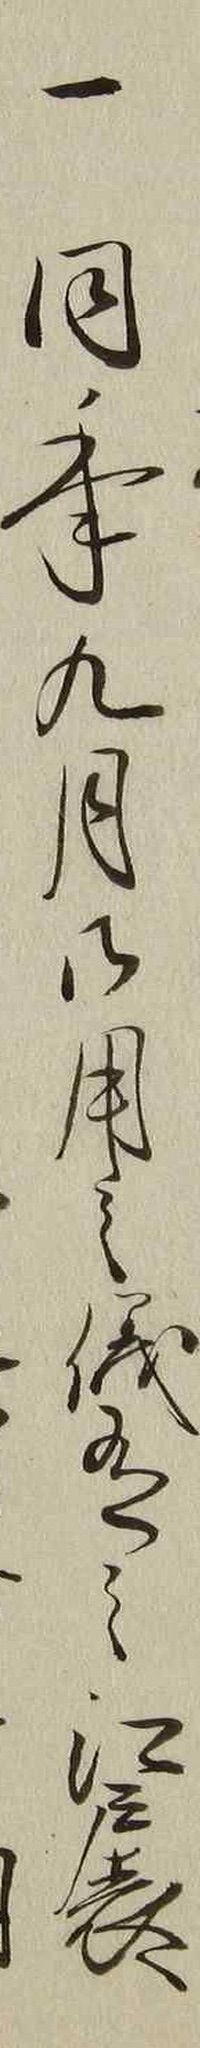一同年九月御用之儀有之江戸表へ
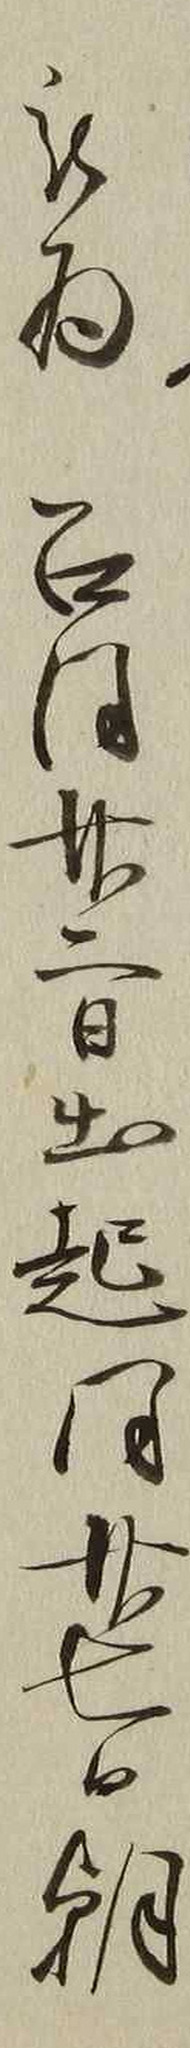被為召同廿二日出起同廿七日朝
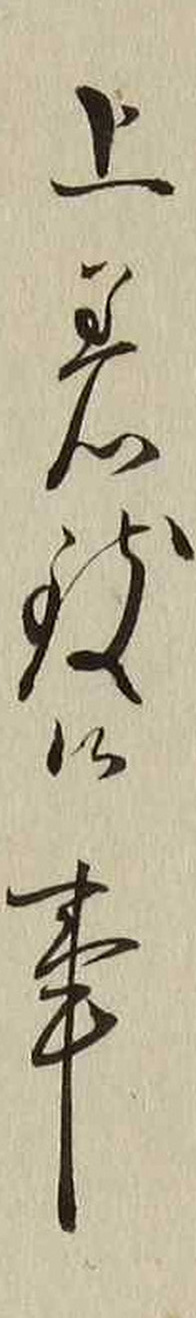上着致侯事
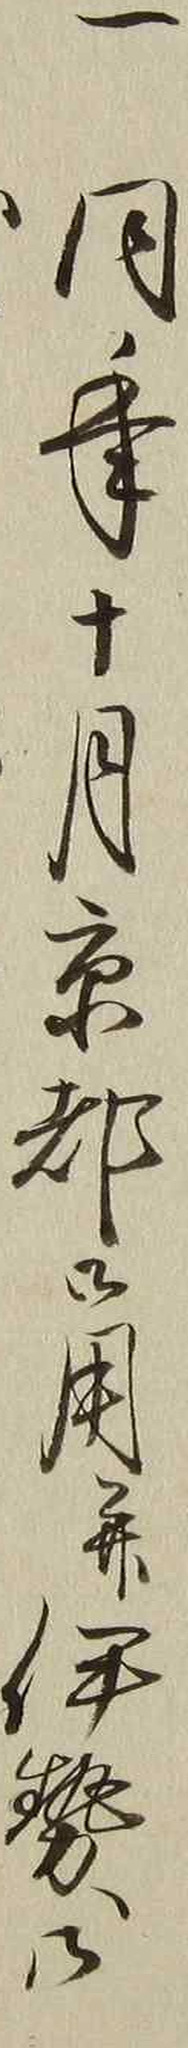一同年十月京都御用并伊勢へ御
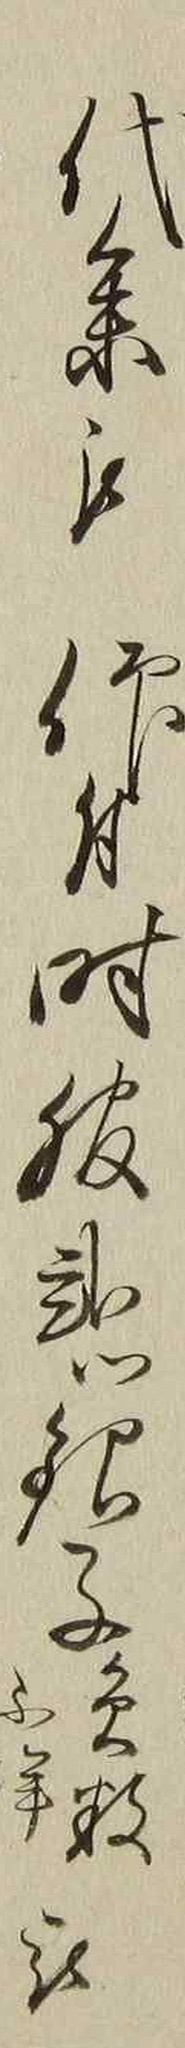代参被仰付時服弐つ銀子員数被
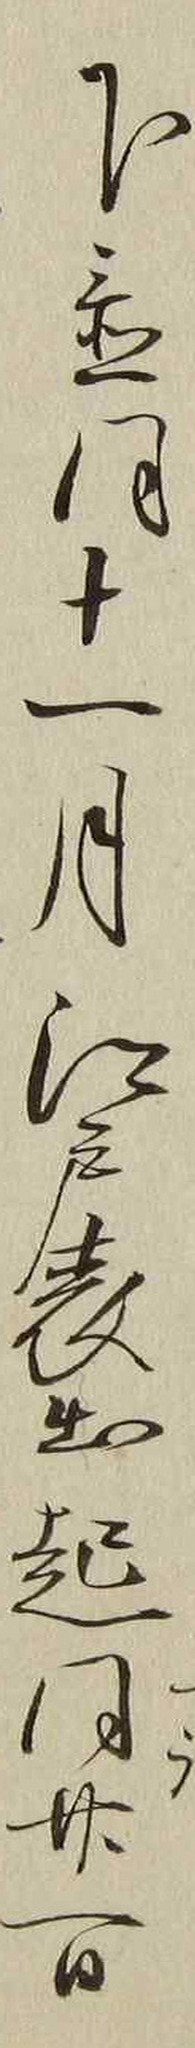下置同十一月江戸表出起同廿一日
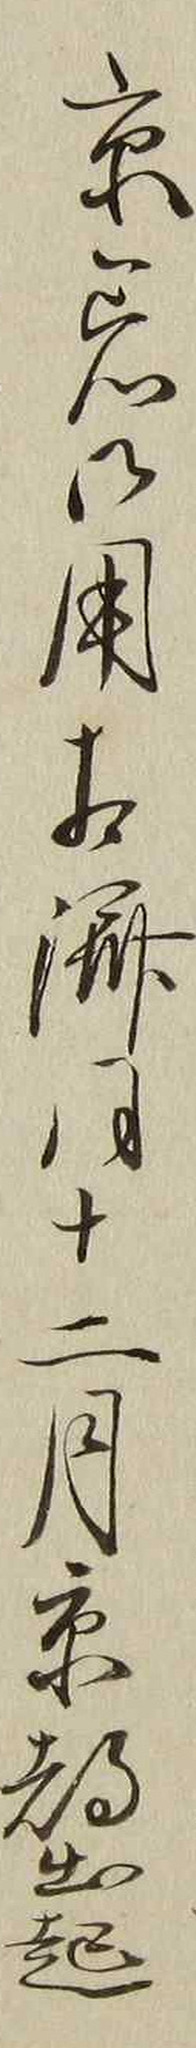京着御用相済同十二月京都出起
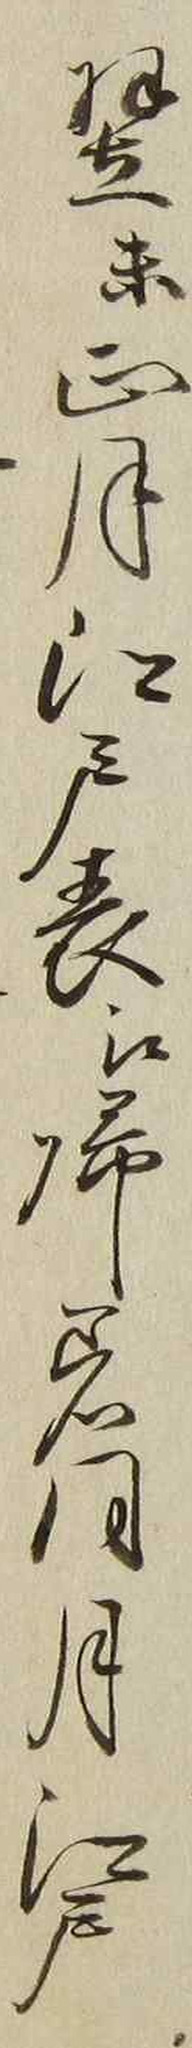翌未正月江戸表江帰着同月江戸
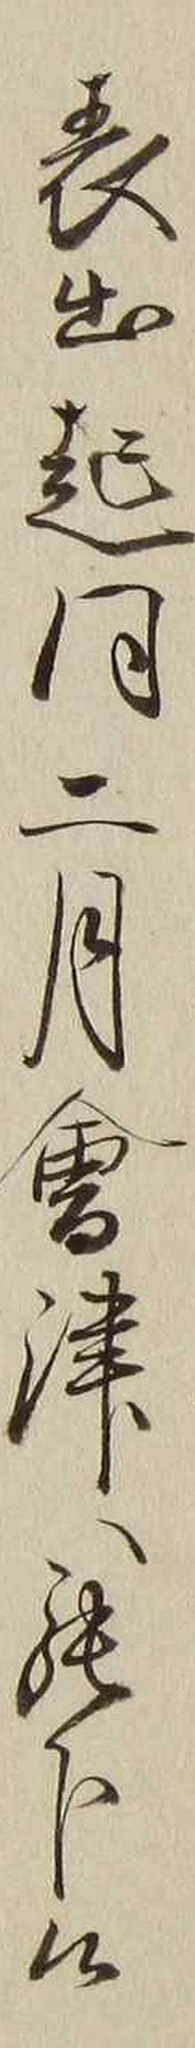表出起同二月会津へ罷下候
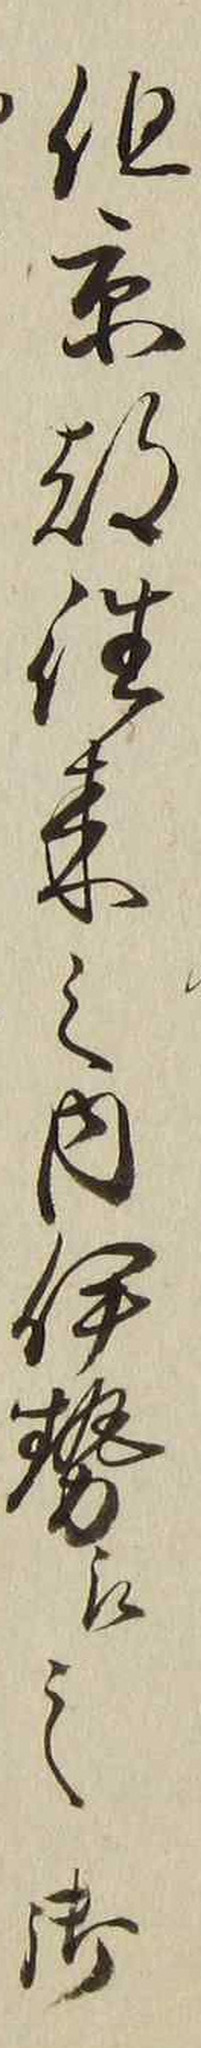但京都往来之内伊勢へ之御
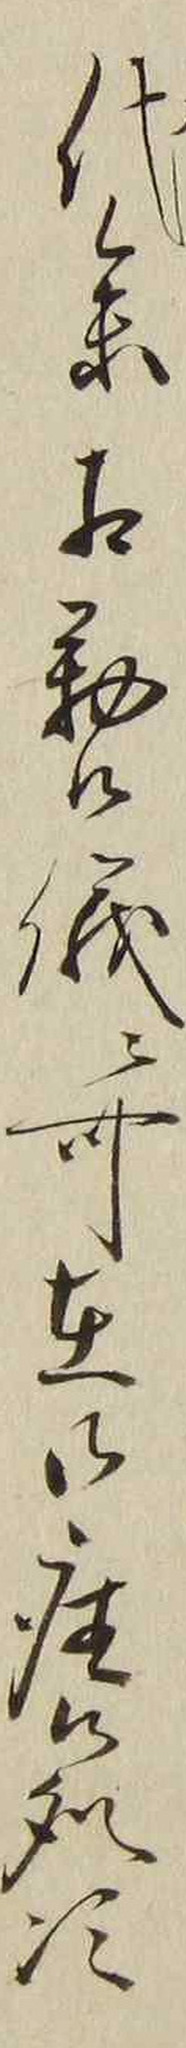代参相勤候儀に可在御座候処次
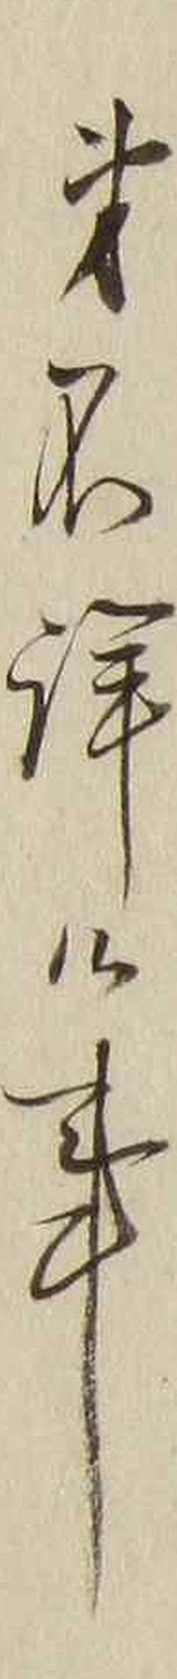第不詳候事

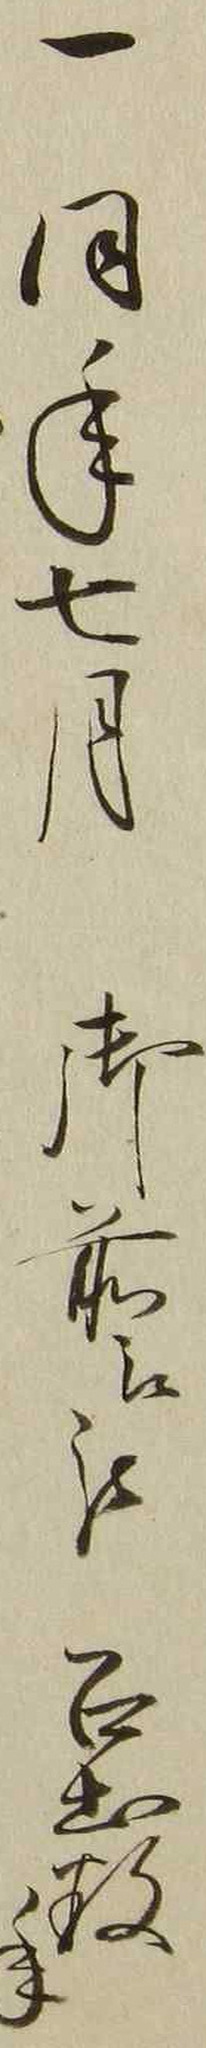一同年七月御前江被召出数年
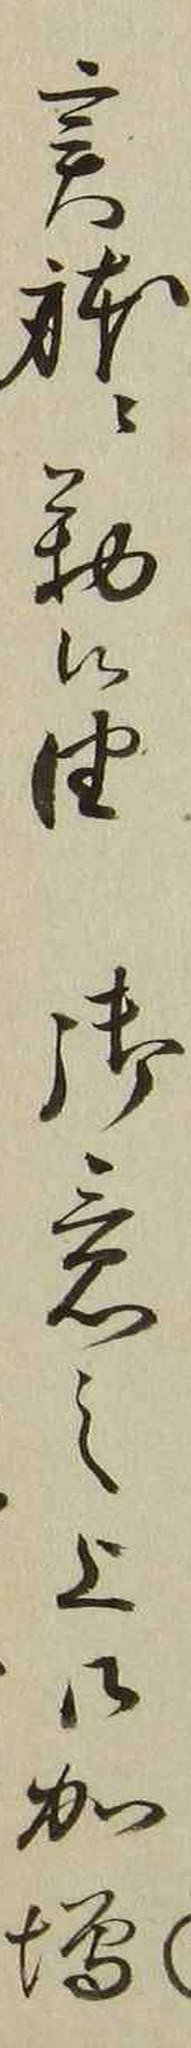実体に勤候由御意之上御加増
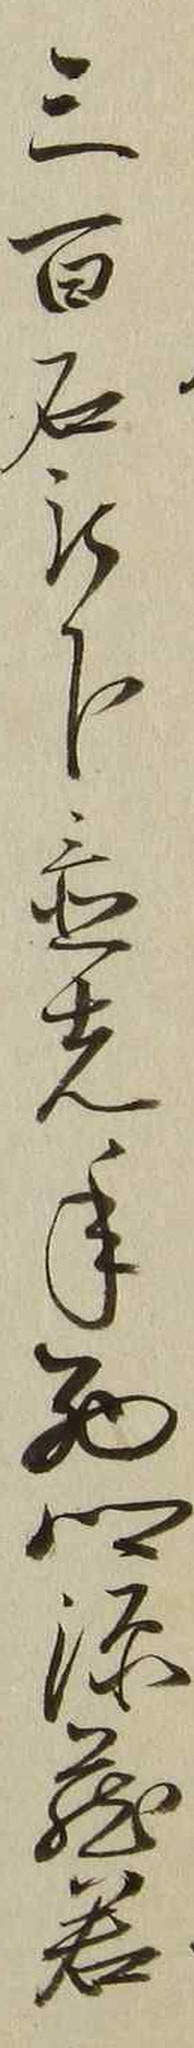三百石被下置先年西卿源蔵若
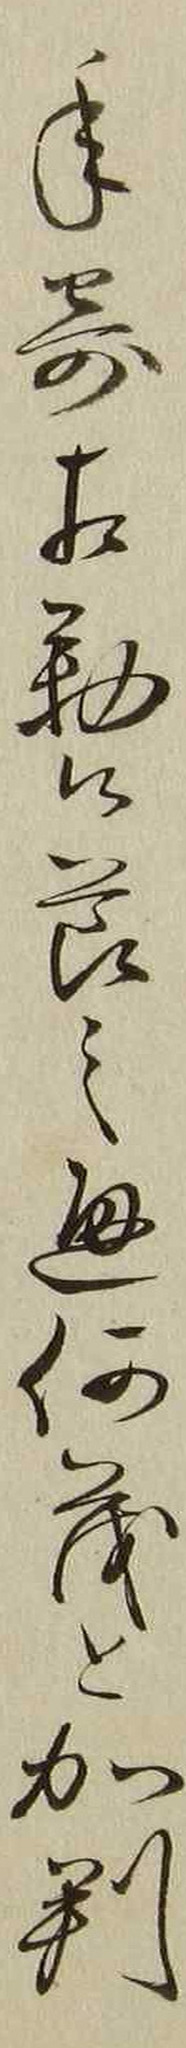年寄相勤候節之通何茂と加判
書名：諸士系譜　巻之103　か之部11
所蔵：会津若松市立会津図書館
